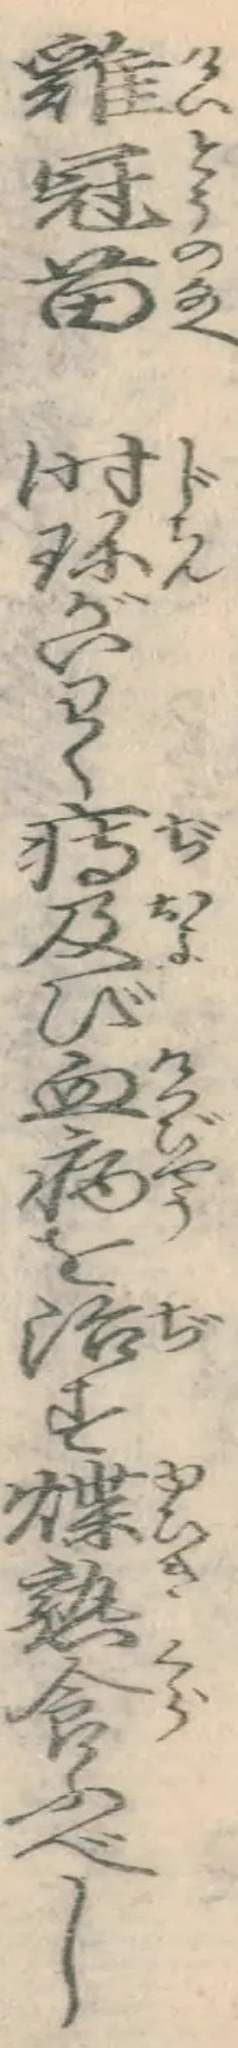雞冠苗時珎がいわく痔及び血病を治す煠熟食ふべし
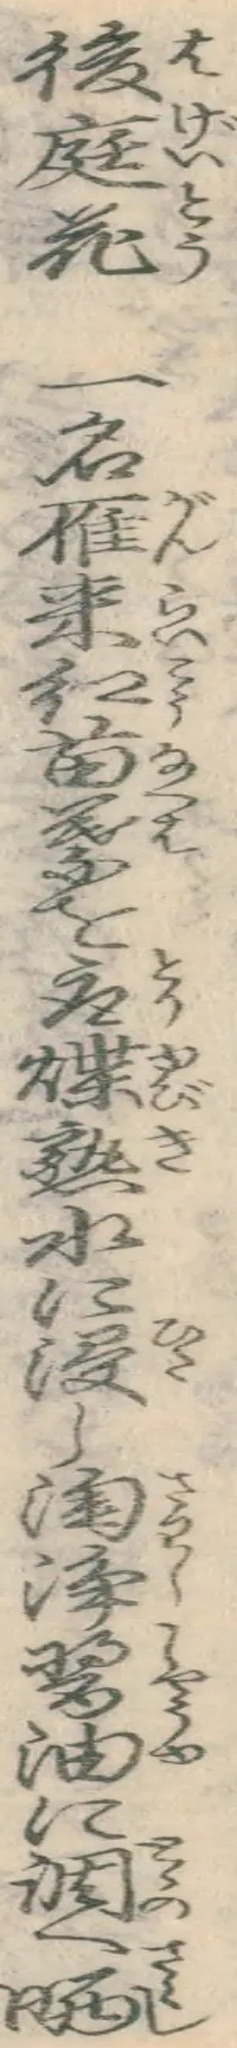後庭花一名雁来紅苗葉を取煠熟水に浸し淘浄醤油に調へ晒
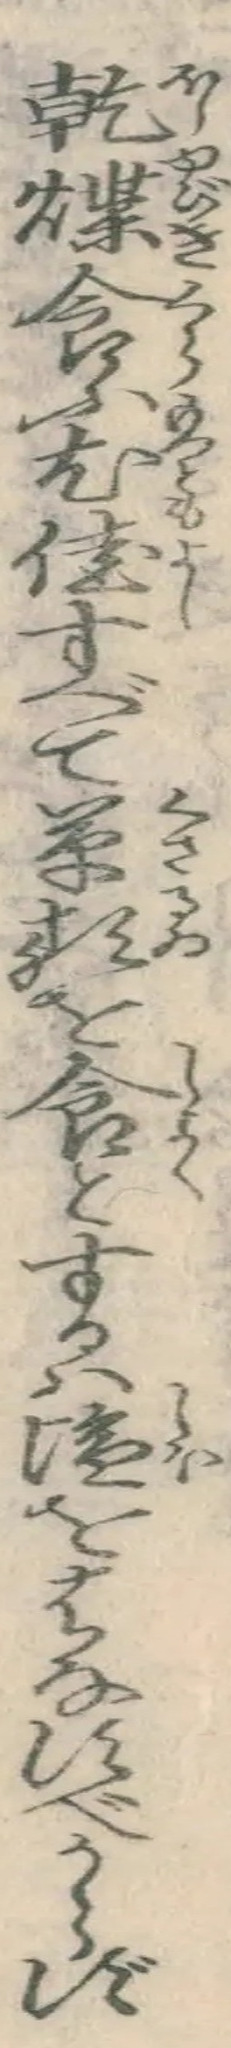乾煠食ふ尤佳すべて草類を食とするは塩をはなすべからず
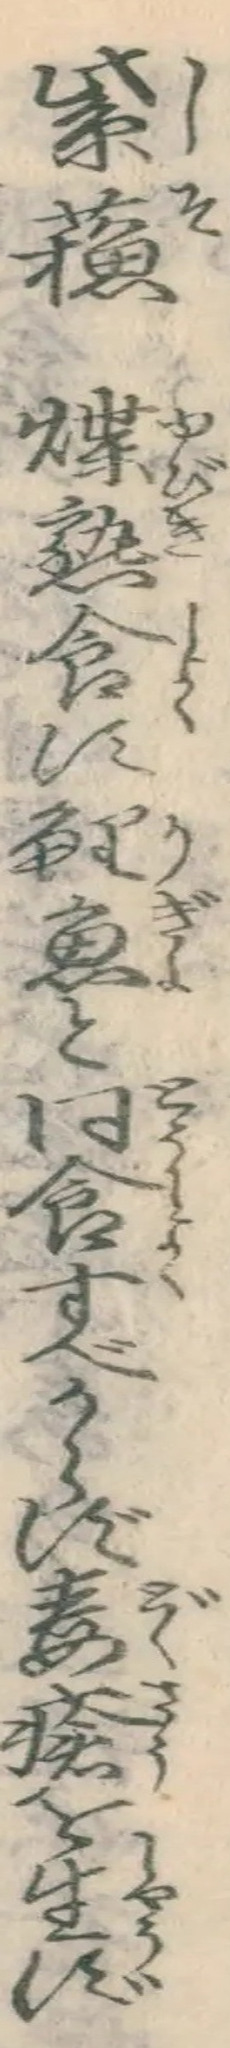紫蘇煠熟食す鯉魚と同食すべからず毒瘡を生ず
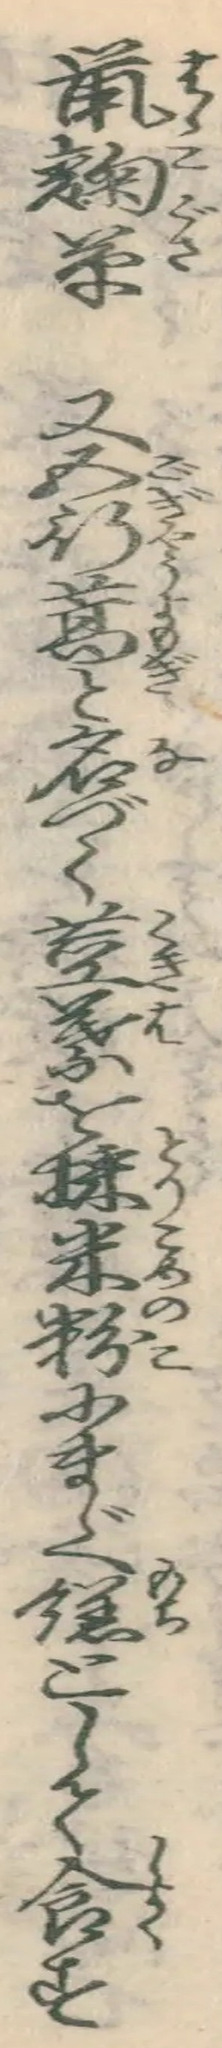鼠麹草又五行蒿と名づく茎葉を採米粉にまじへ餻として食す
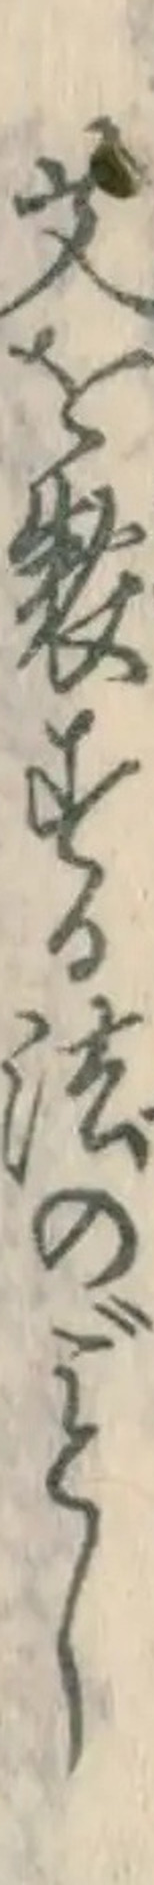艾を製する法のごとし
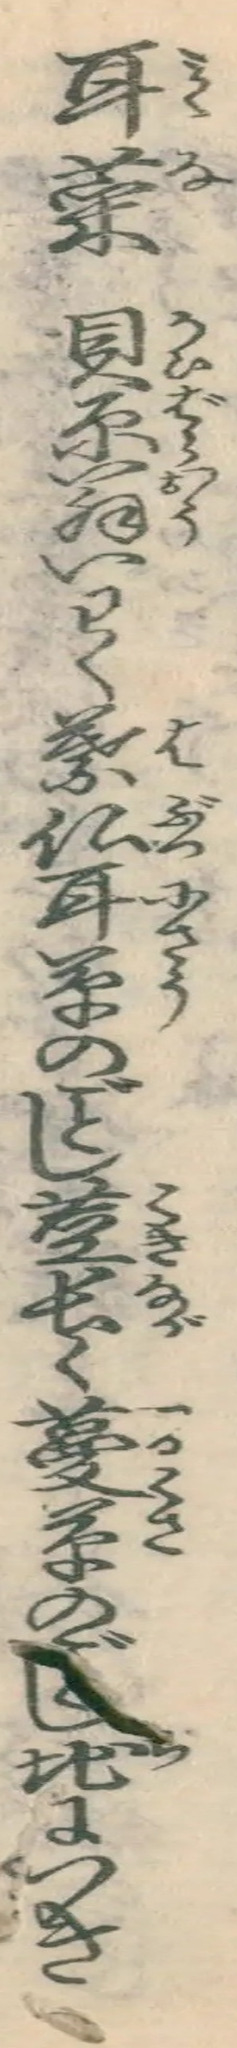耳菜貝原翁いわく葉仏耳草のごとし茎長く蔓草のごとし地につき

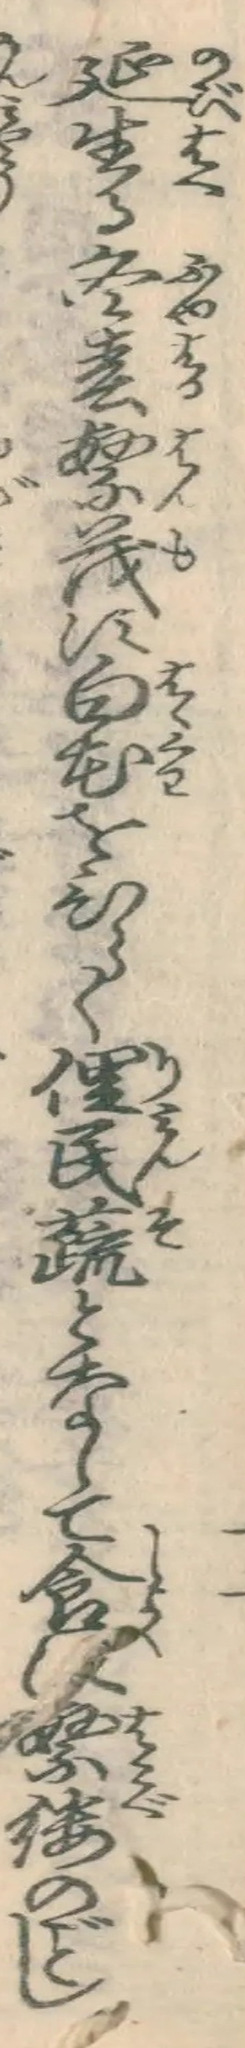延生る冬春繁茂す白花をひらく俚民蔬となして食す絮縷のごとし
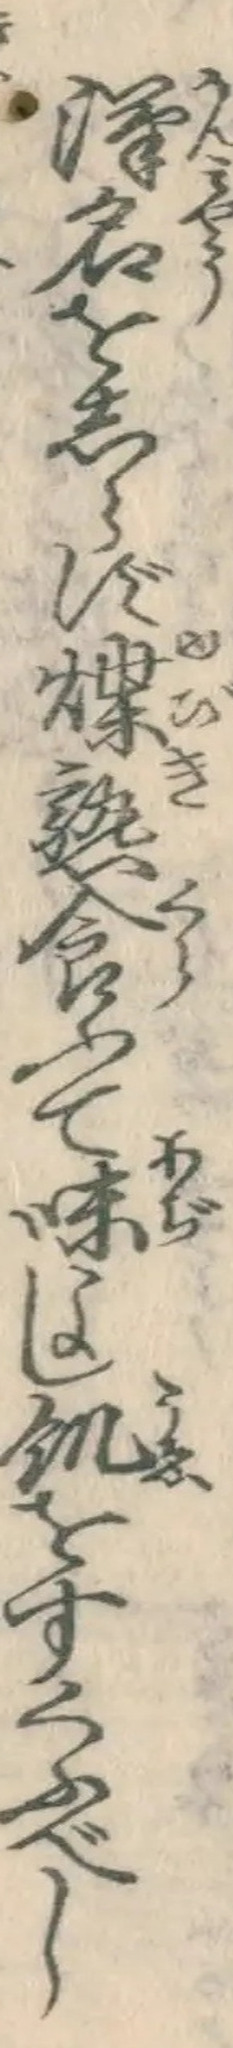漢名をしらず煠熟食ふて味よし飢をすくふべし
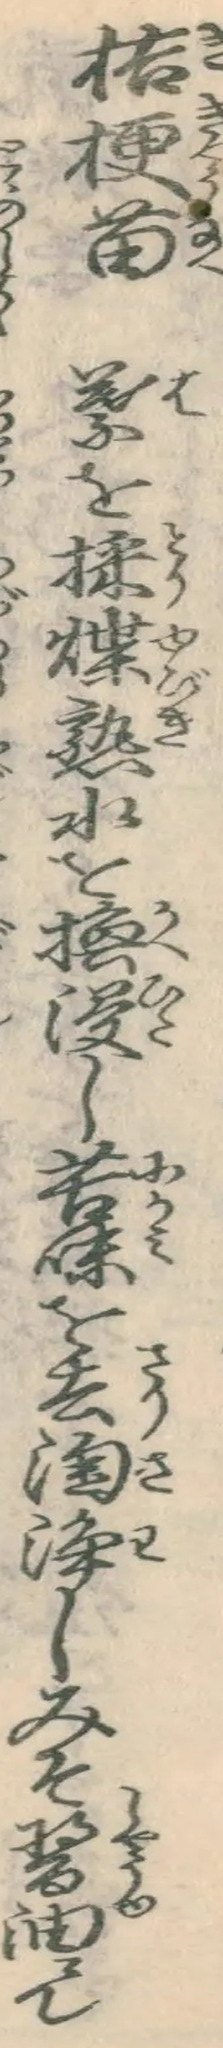桔梗苗葉を採煠熟水を換浸し苦味を去淘浄しみそ醤油にて
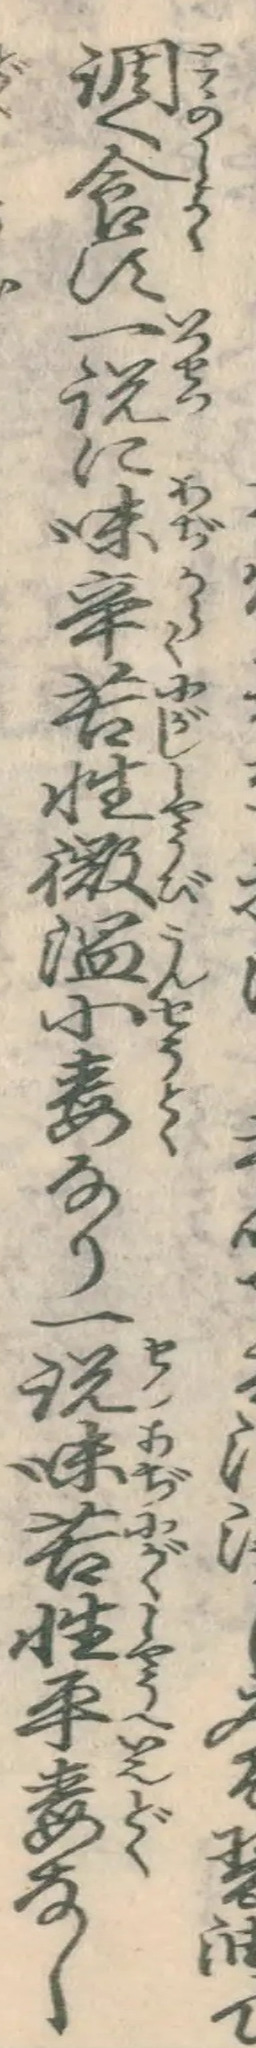調へ食す一説に味辛苦性微温小毒なり一説味苦性平毒なし
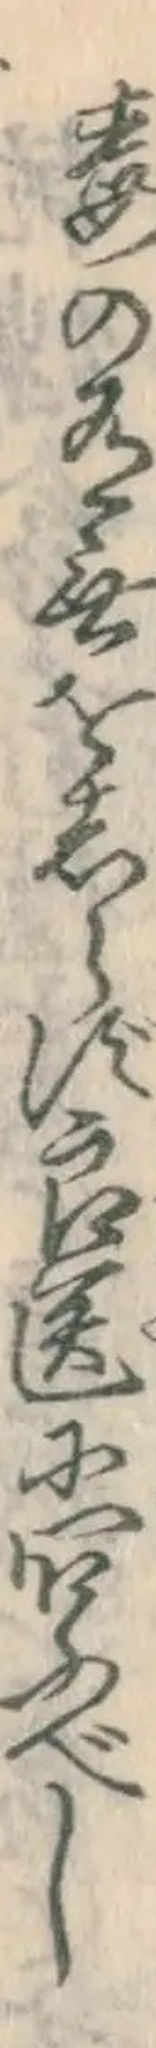毒の有無をしらず良医に問ふべし
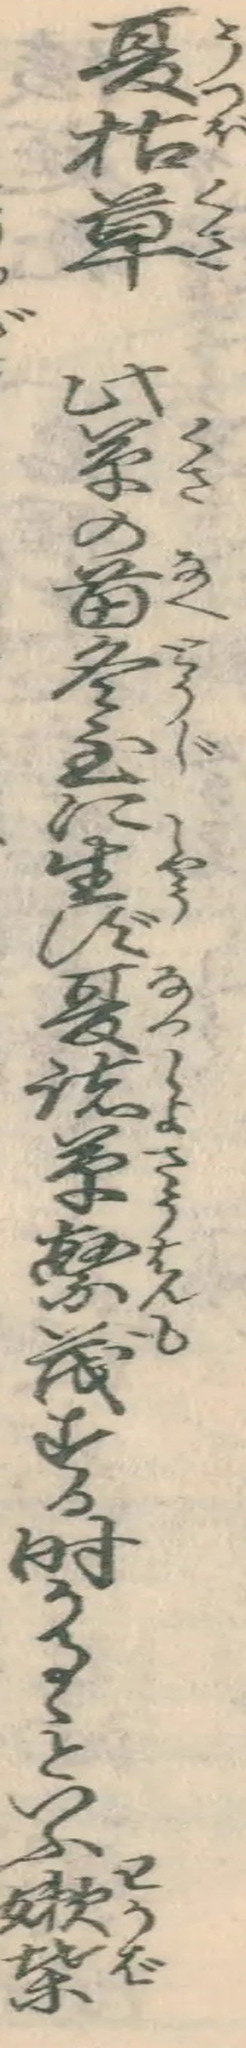夏枯草此草の苗冬至に生ず夏諸草繁茂する時かるるといふ嫰葉
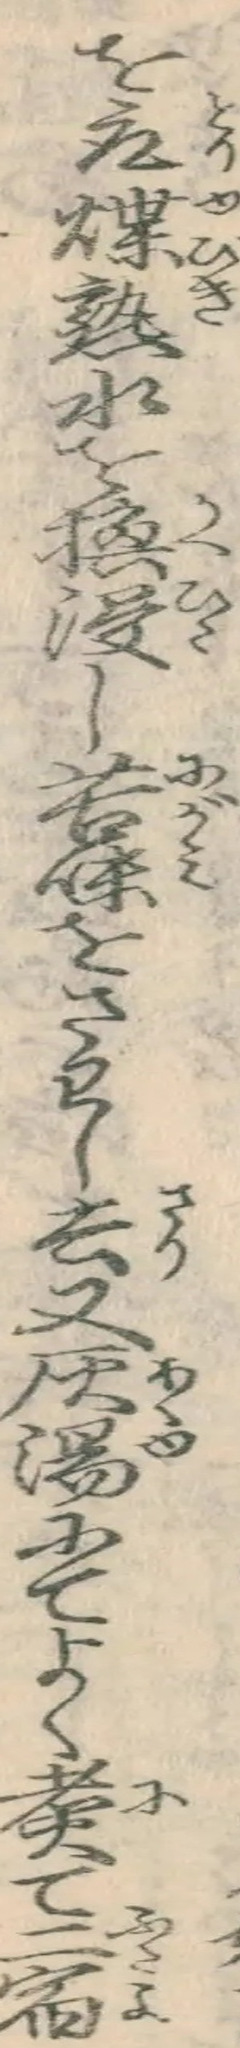を取煠熟水を換浸し苦味をさわし去又灰湯にてよく煑て二宿
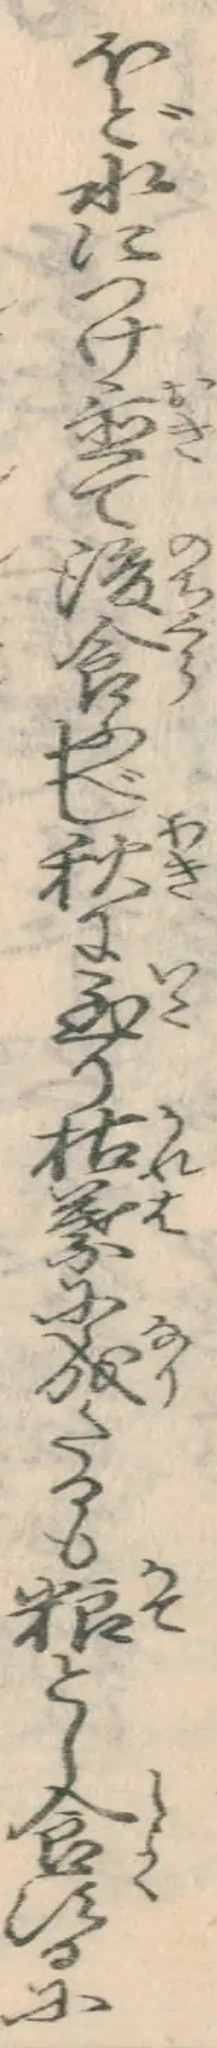ほど水につけ置て後食ふべし秋に至り枯葉に成たるも粮とし食するに
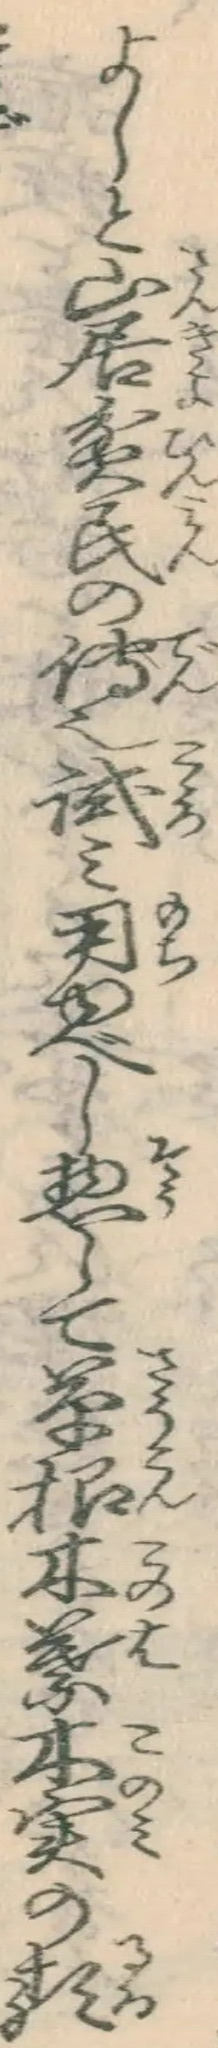よしと山居貧民の傳也試み用ゆべし惣して草根木葉木実の類
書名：経済をしへ草
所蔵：国立国会図書館 National Diet Library, JAPAN
